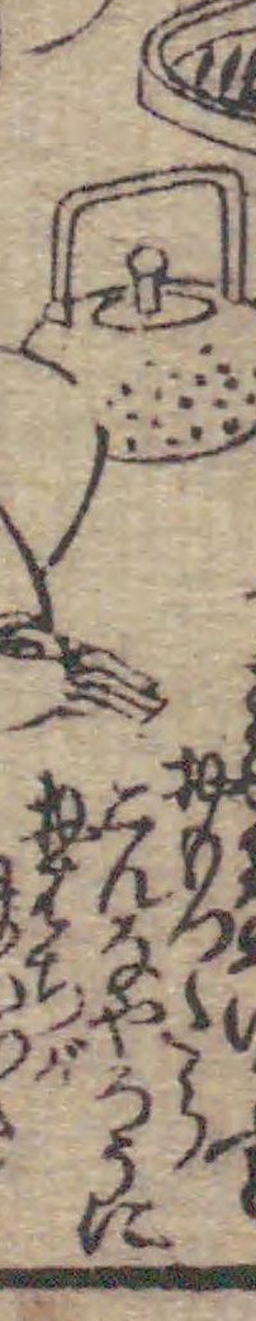こんなやろうに
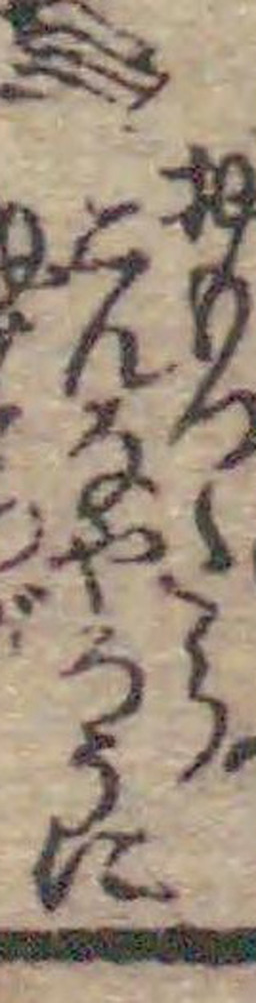こんなやろうに
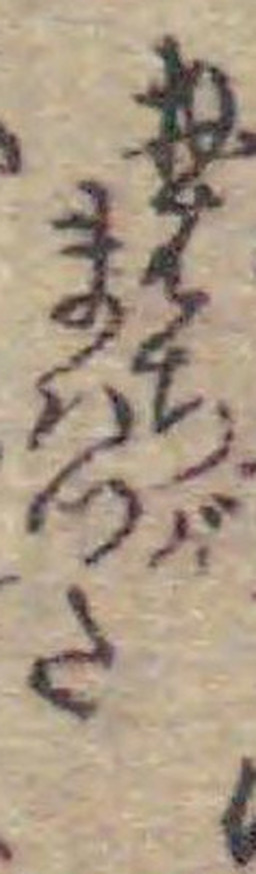まはつた
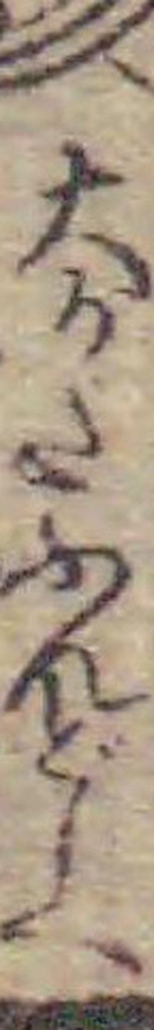大かたふんどしへ
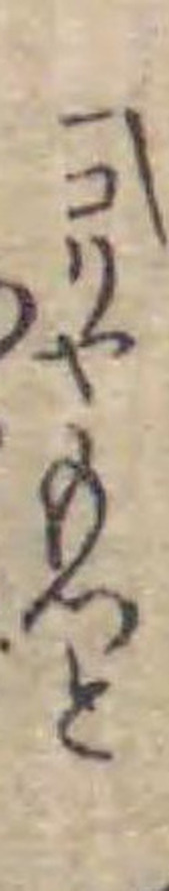〽コリヤもつと
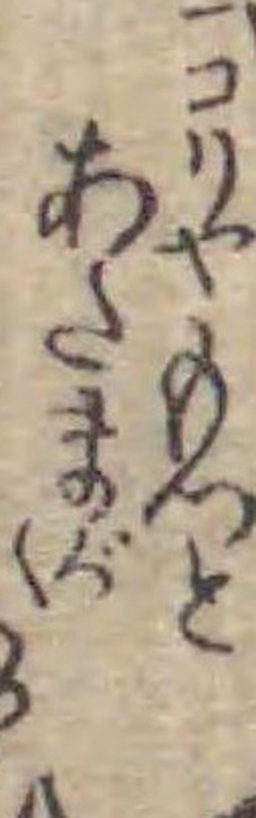あたまが
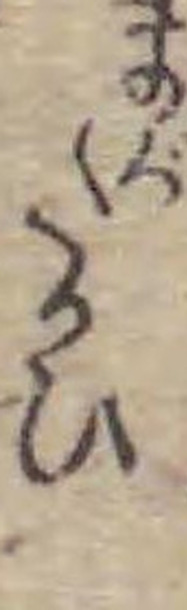たかひ
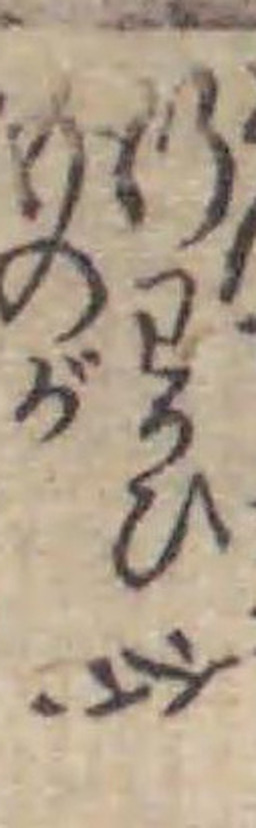ものが
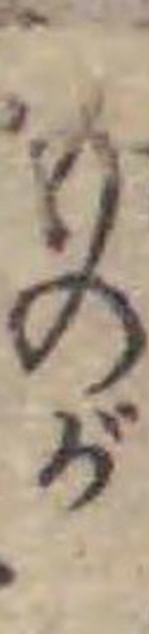ものが
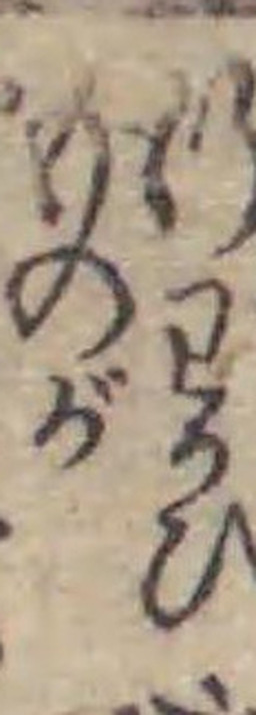ものが
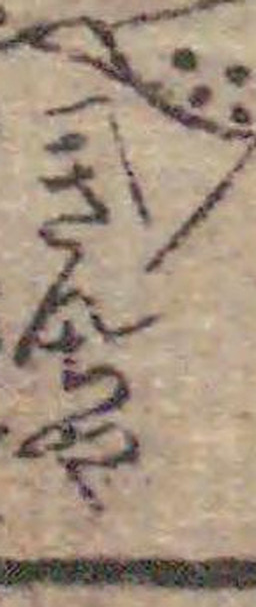〽きんちや
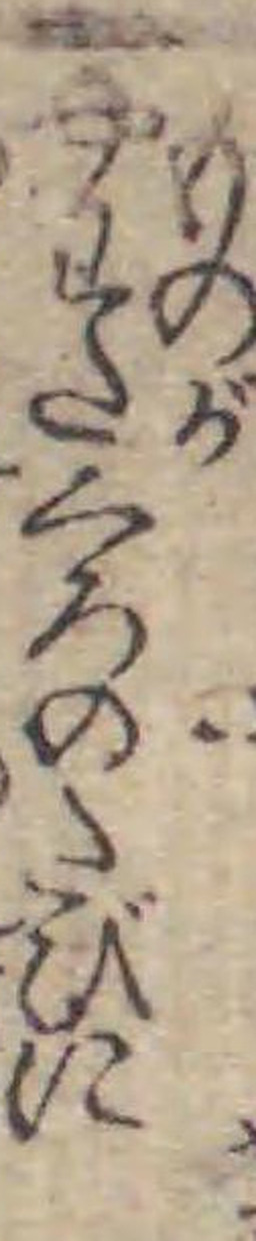やわたくろのたびに
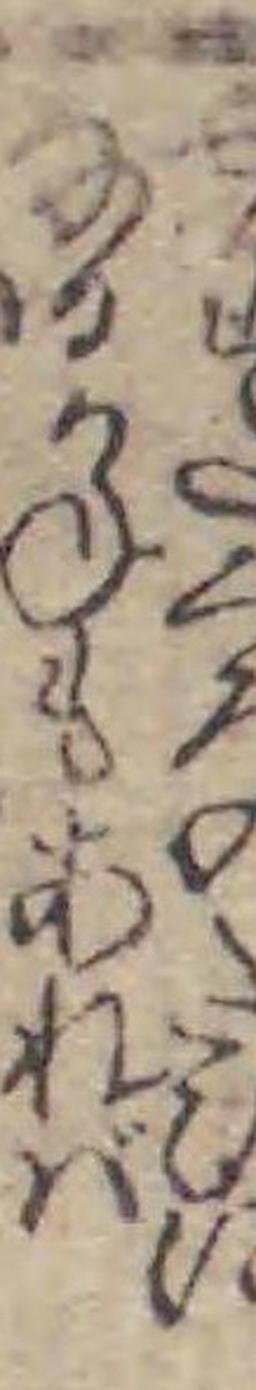なるかねもあれば
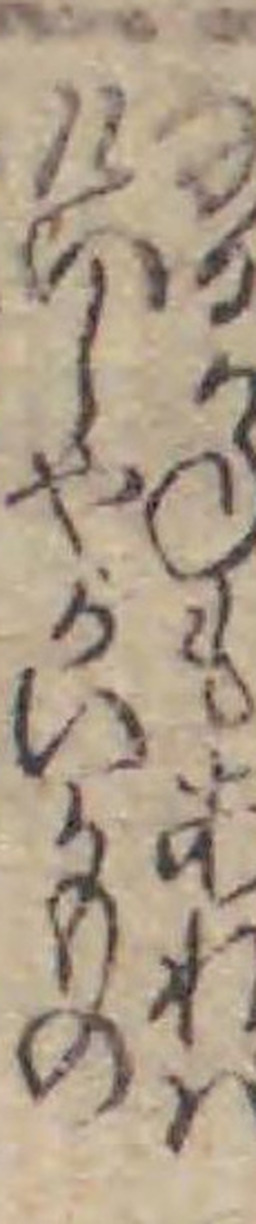けいしやがいかもの
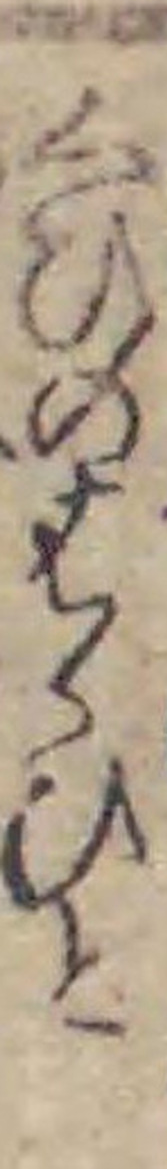くひのはらひと
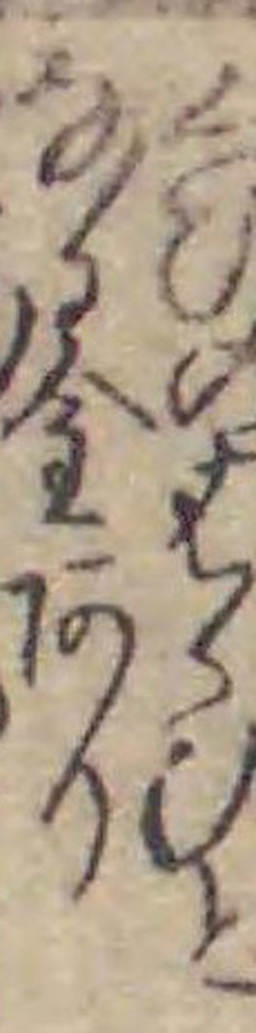なる金あり
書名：新鋳小判 : 3巻
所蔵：国立国会図書館 National Diet Library, JAPAN
